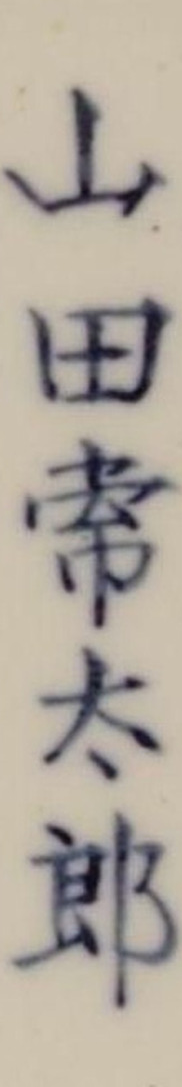山田常太郎
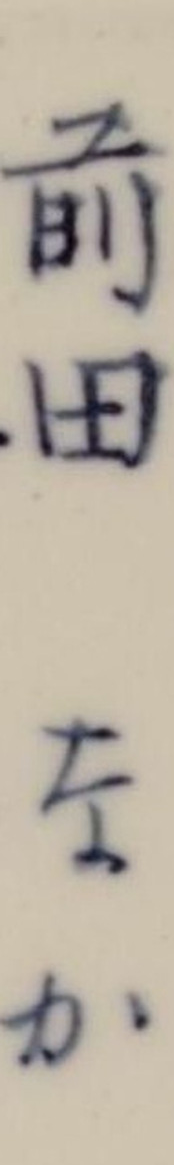前田なか
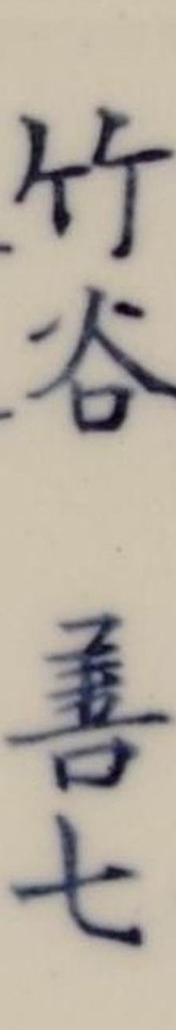竹谷善七
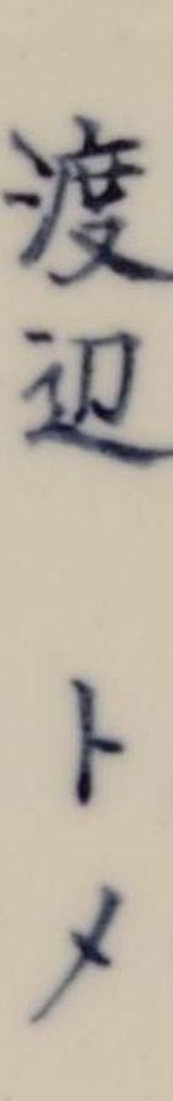渡辺トメ
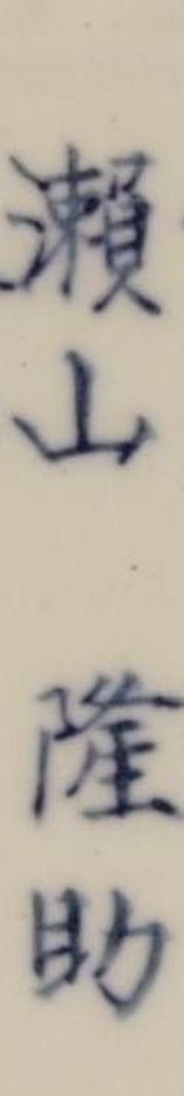瀬山隆助
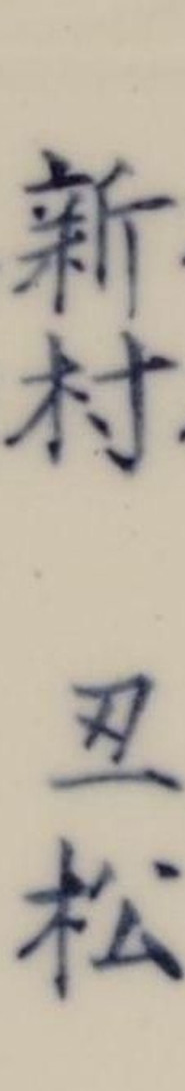新村丑松
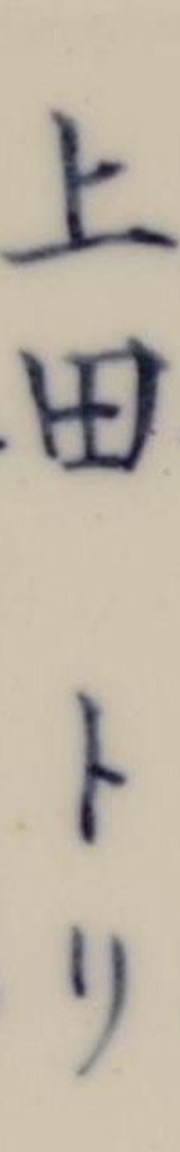上田トリ
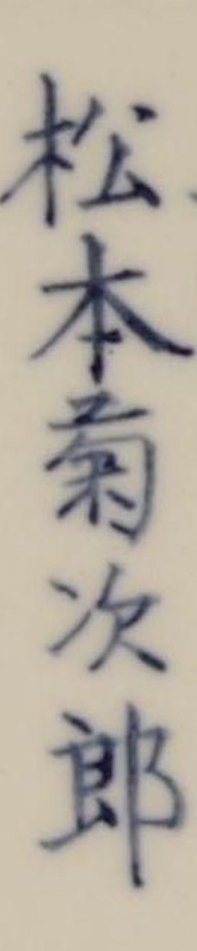松本菊次郎
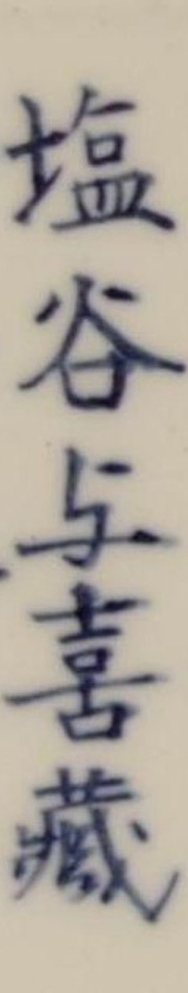塩谷与喜蔵
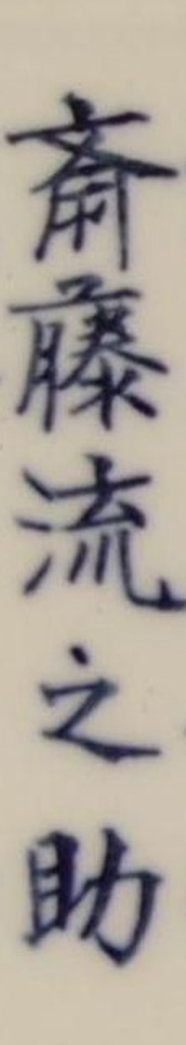斉藤流之助
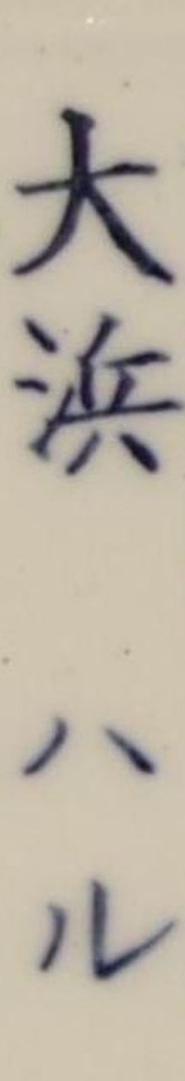大浜ハル
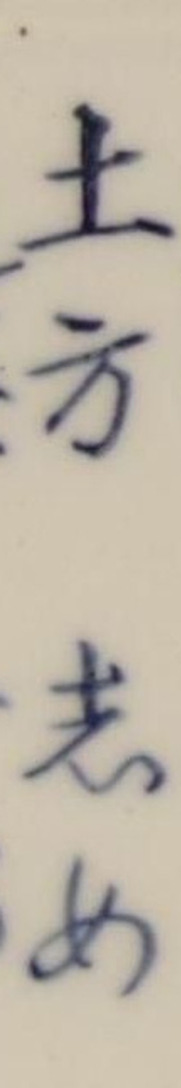土方しめ
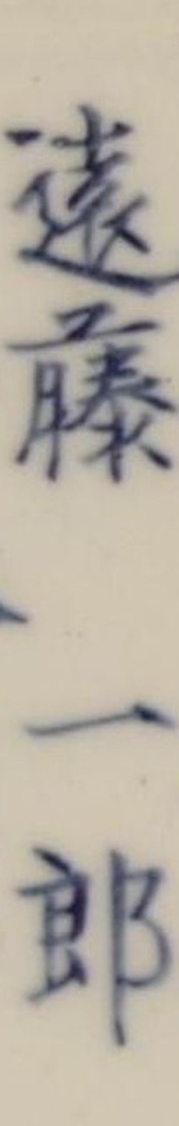遠藤一郎
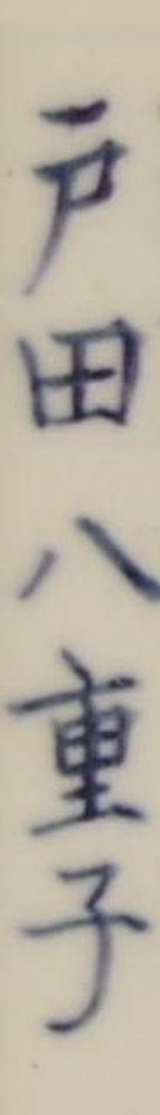戸田八重子

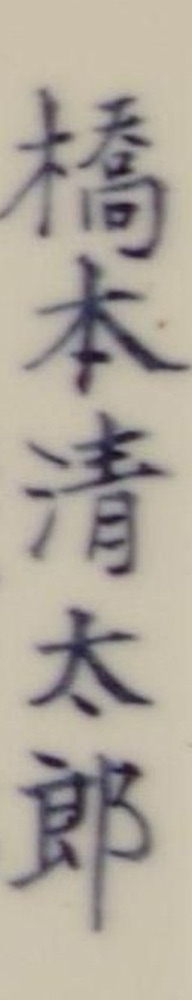橋本清太郎
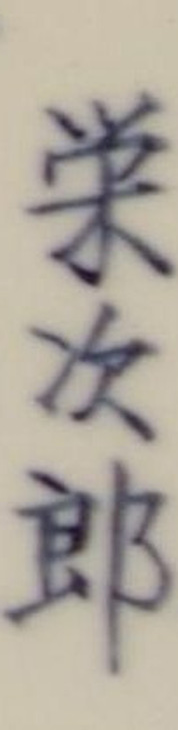栄次郎
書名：E~L
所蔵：高野山金剛峯寺
